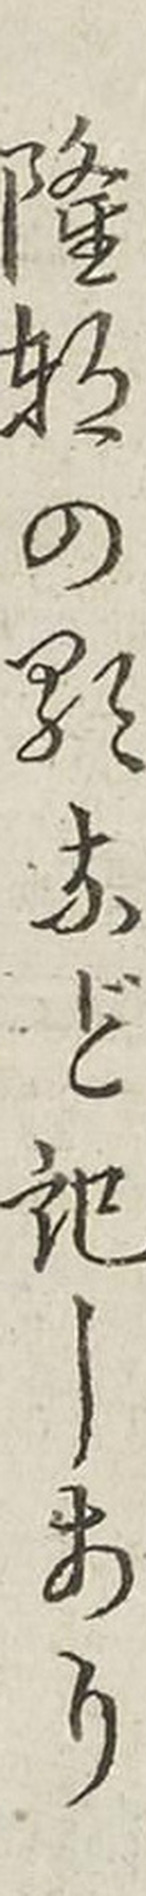隆朝の影など記しあり
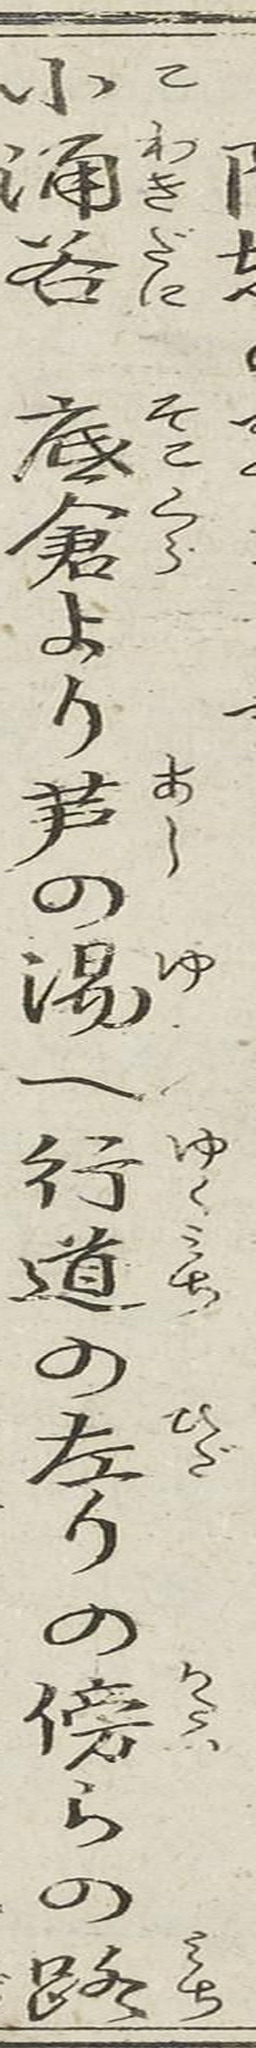小涌谷底倉より芦の湯へ行道の左りの傍らの路
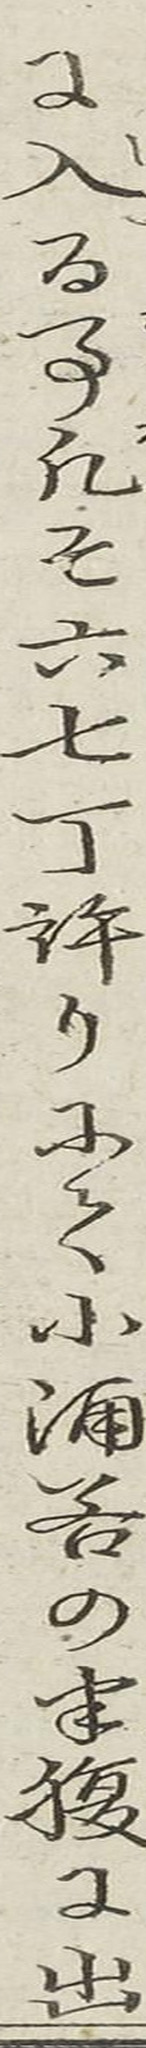に入る事凡そ六七丁許りにて小涌谷の半復に出
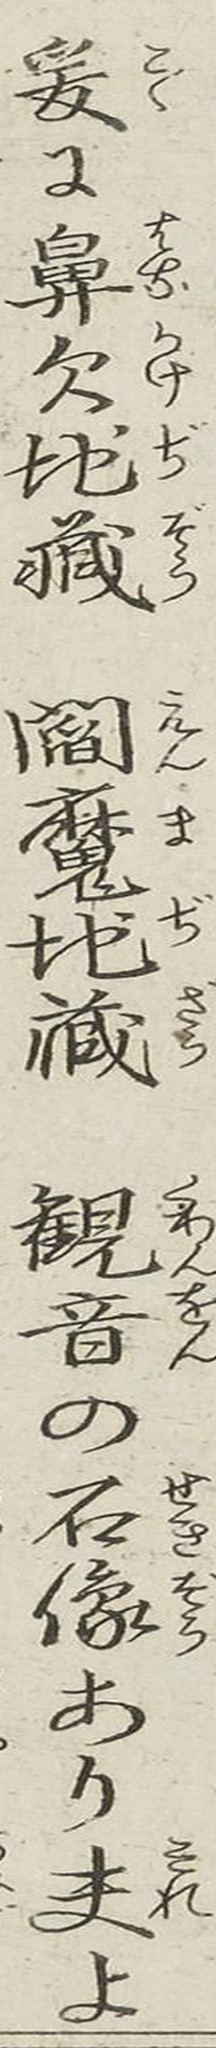爰に鼻欠地蔵閻魔地蔵観音の石像あり夫よ
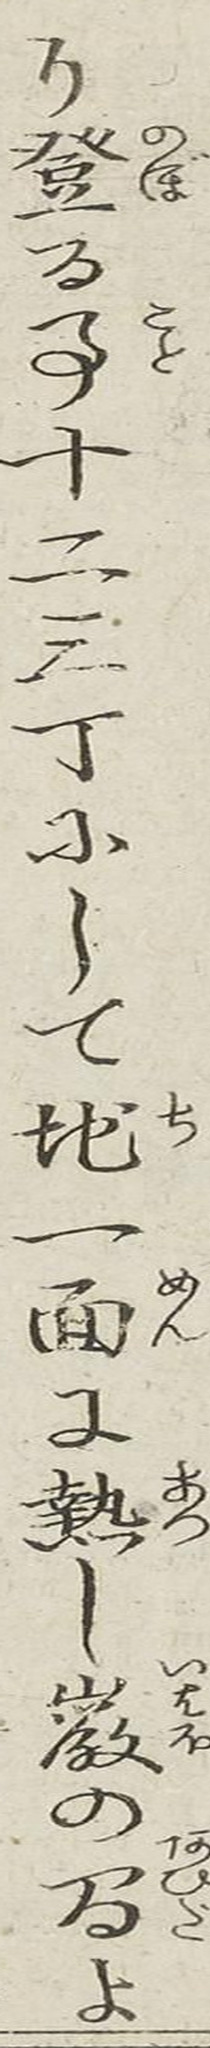り登る事十二三丁にして地一面に熱し巌の間よ
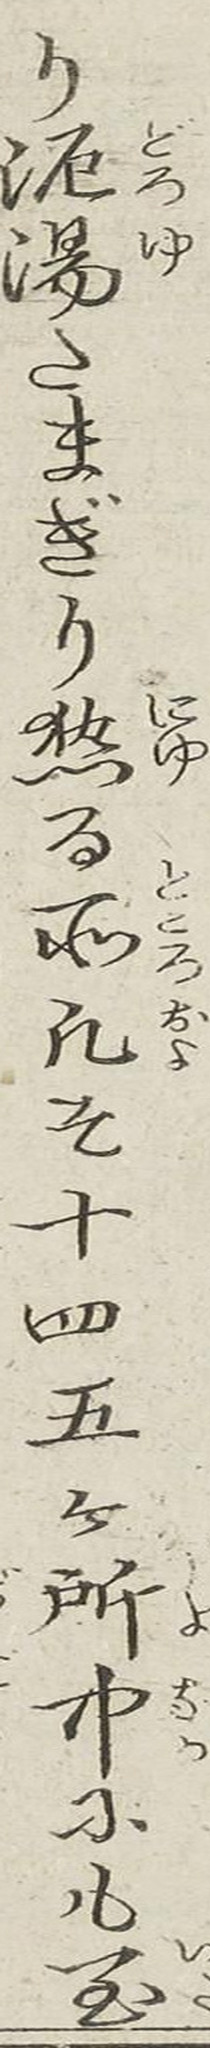り泥湯たまぎり熱る所凡そ十四五ケ所中にも至
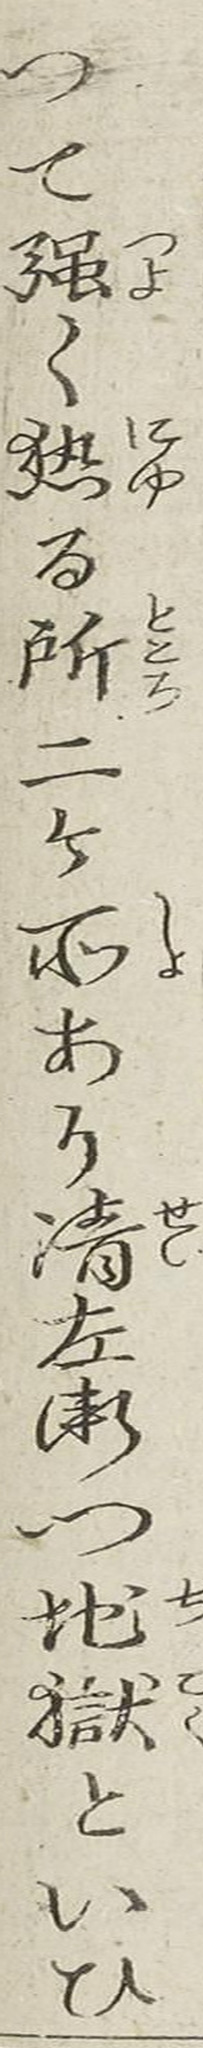つて強く熱る所二ケ所あり清左衛門地獄といひ
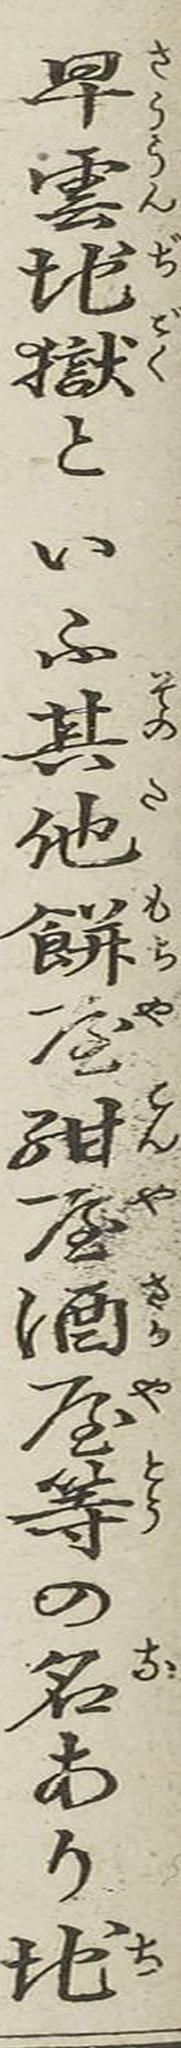早雲地獄といふ其他餅屋紺屋酒屋等の名あり地
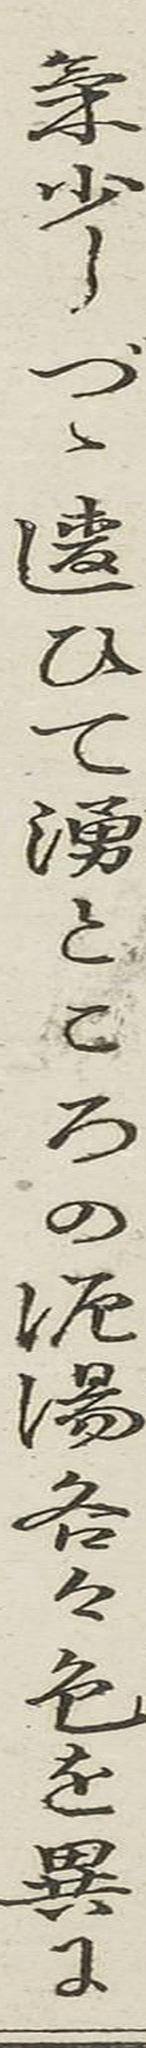気少しづゝ違ひて涌ところの泥湯各々色を異に
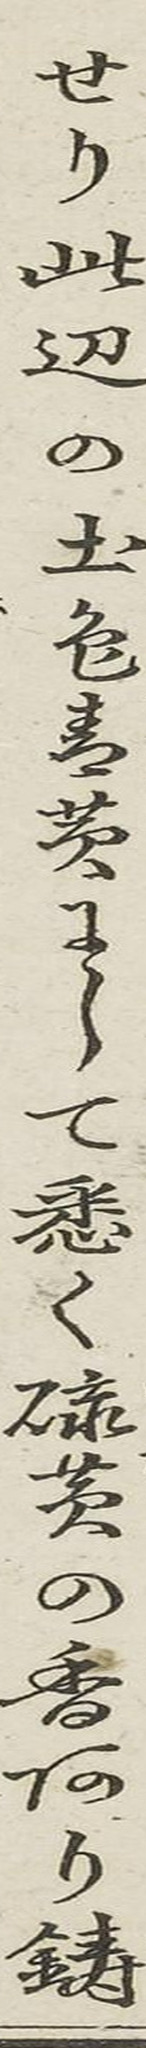せり此辺の土色青黄にして悉く硫黄の香あり鋳
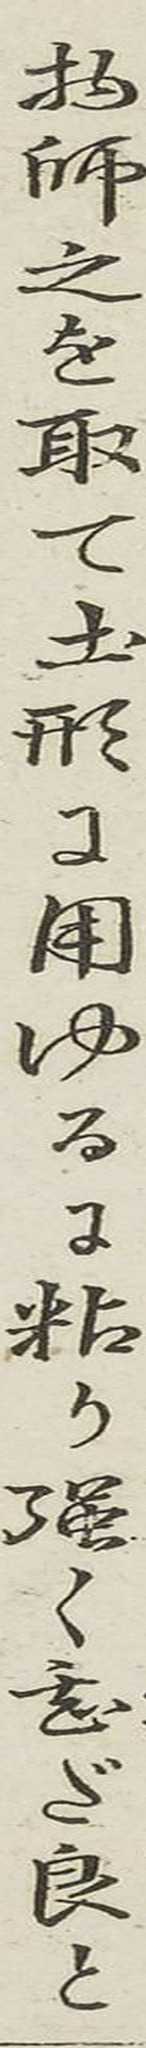物師之を取て土形に用ゆるに粘り強く甚だ良と
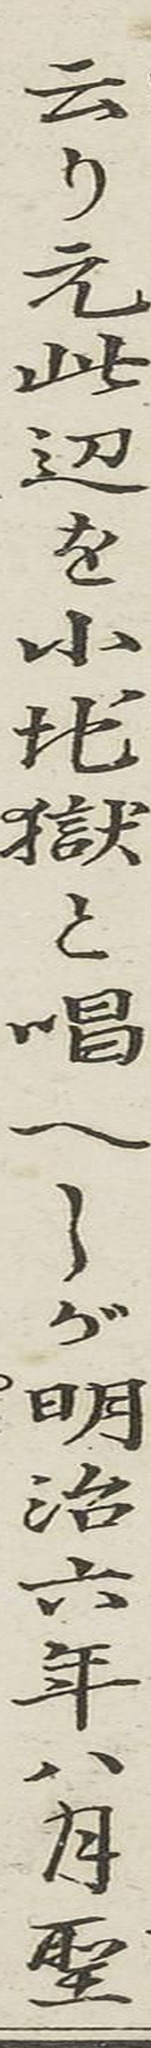云り元此辺を小地獄と唱へしが明治六年八月聖
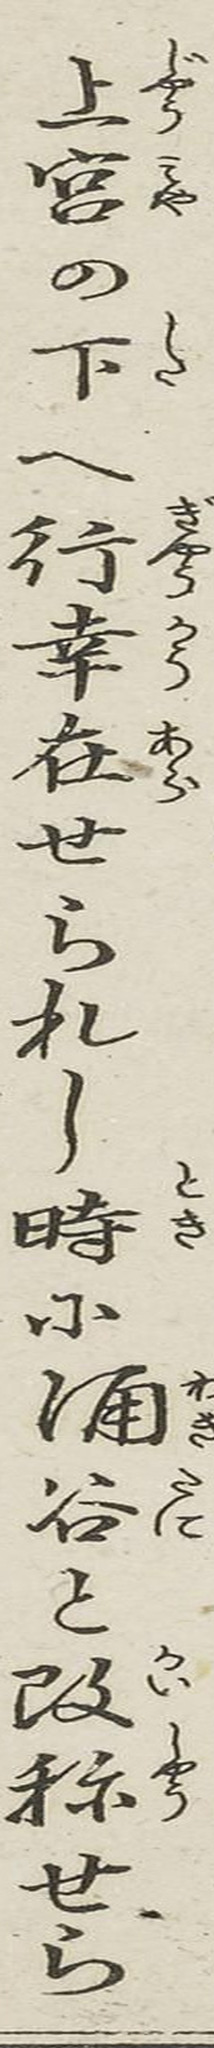上宮の下へ行幸在せられし時に涌谷と改称せら
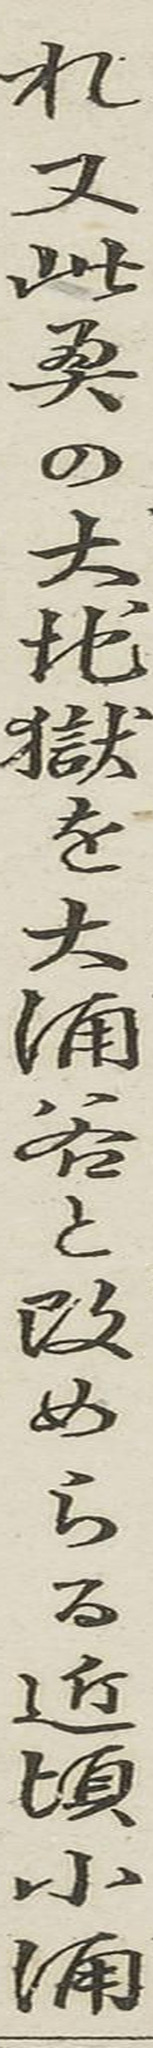れ又此奥の大地獄を大涌谷と改めらる近頃小涌
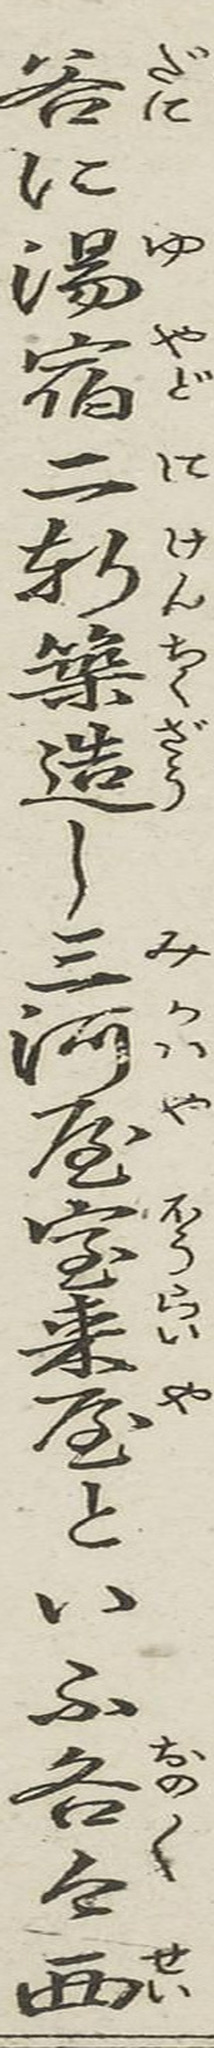谷に湯宿二軒築造し三河屋宝来屋といふ各々西
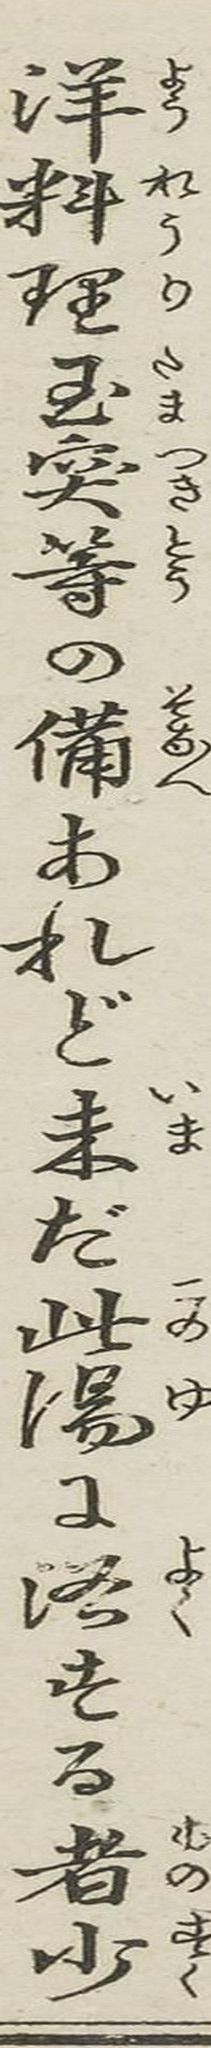洋料理玉突等の備あれど未だ此湯に浴する者少
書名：箱根温泉誌　全
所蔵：東京大学地震研究所図書室 Earthquake Research Institute Library, The University of Tokyo, JAPAN
